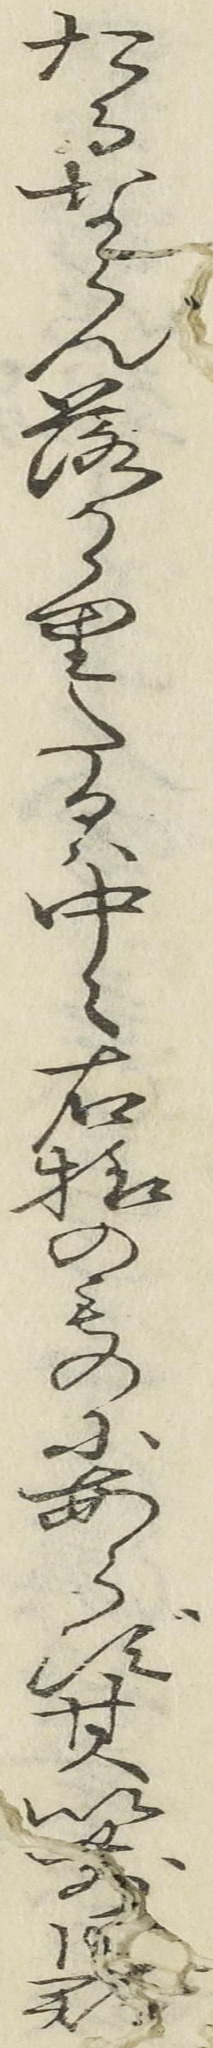たるならん落かゝりたるは中々右様のものにあらず其以前同郡
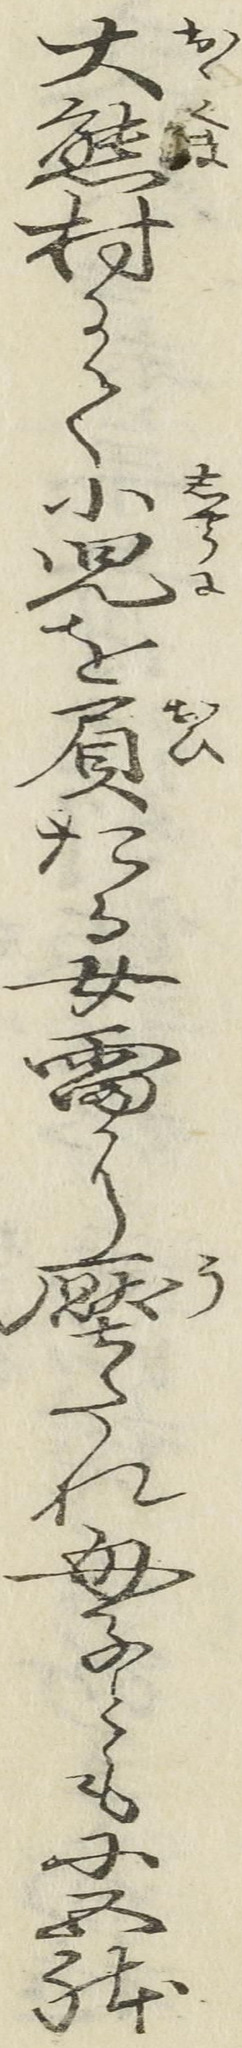大熊村にて小児を負たる女雷に壓たれ母子ともに五躰
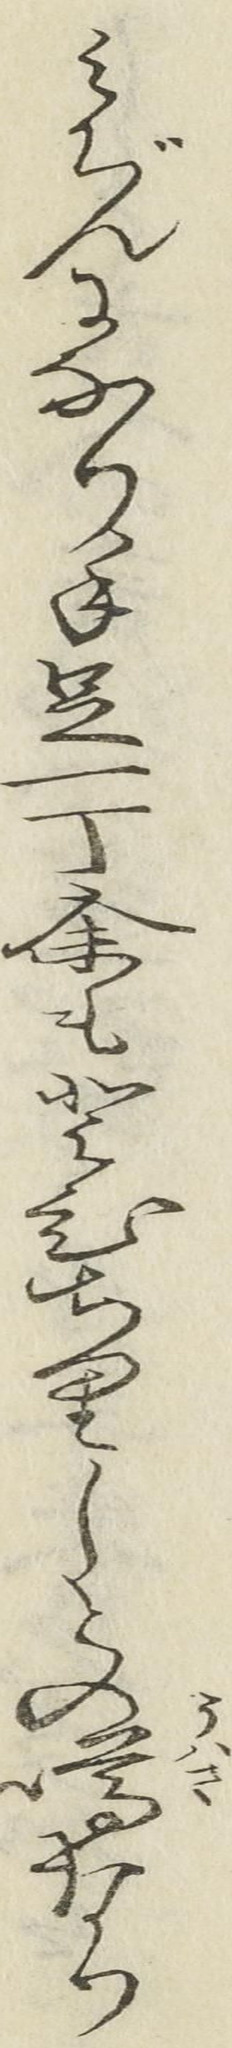みぢんになり手足一丁余もとひちりしとの噂なり
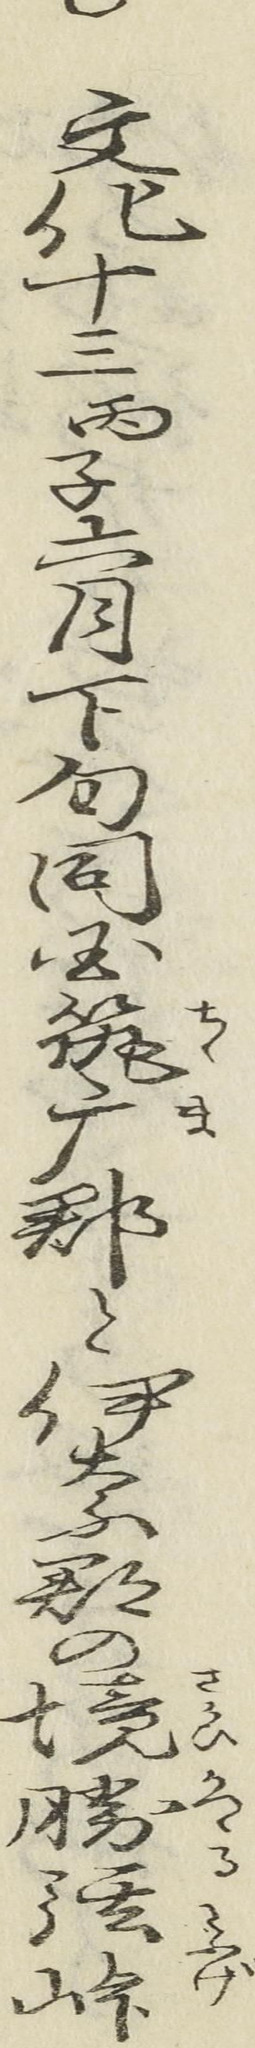〇文化十三丙子六月下旬同国筑摩郡と伊奈郡の境勝弦峠
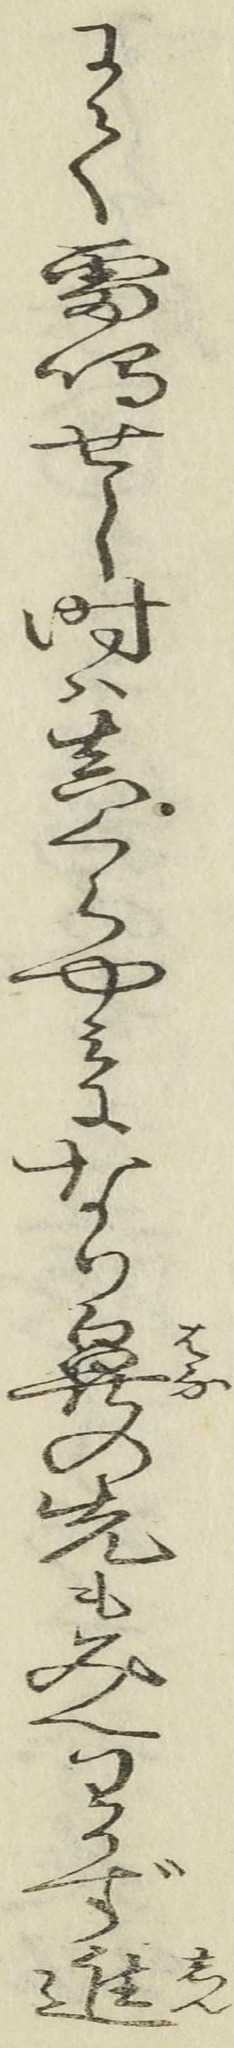にて雷鳴せし時は真くらやみになり鼻の先もみへわかず進
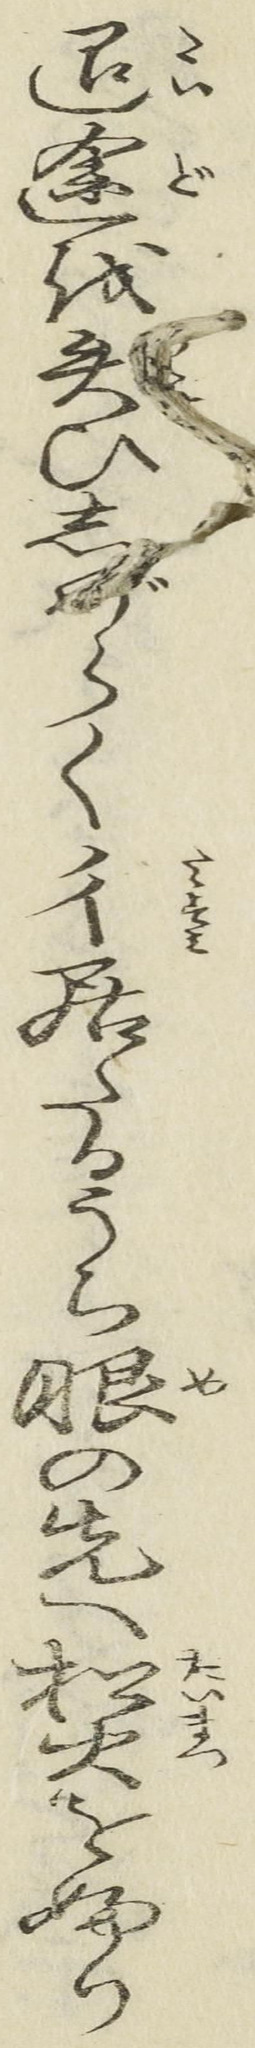退途を失ひしばらく彳居たるうち眼の先へ松火をふり
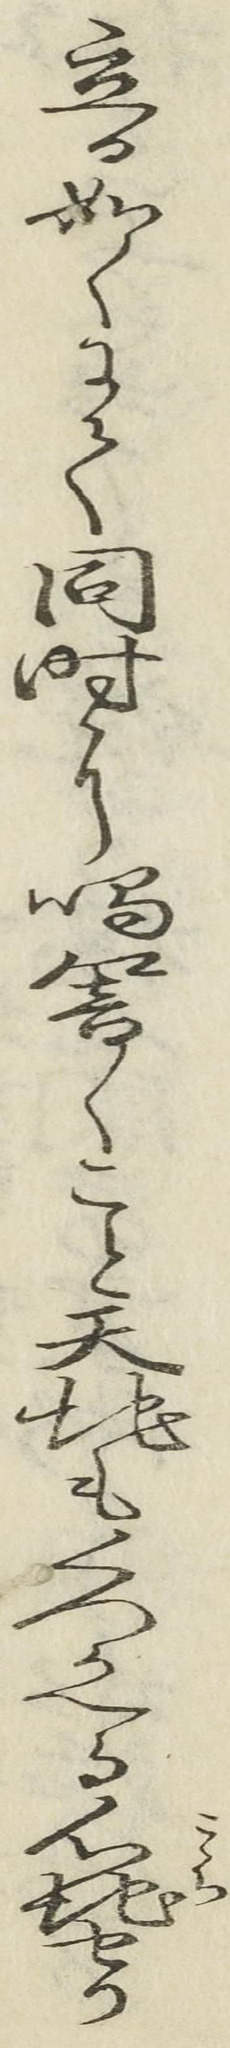立る如くにて同時に鳴響くこと天地もくつかへる心地せり
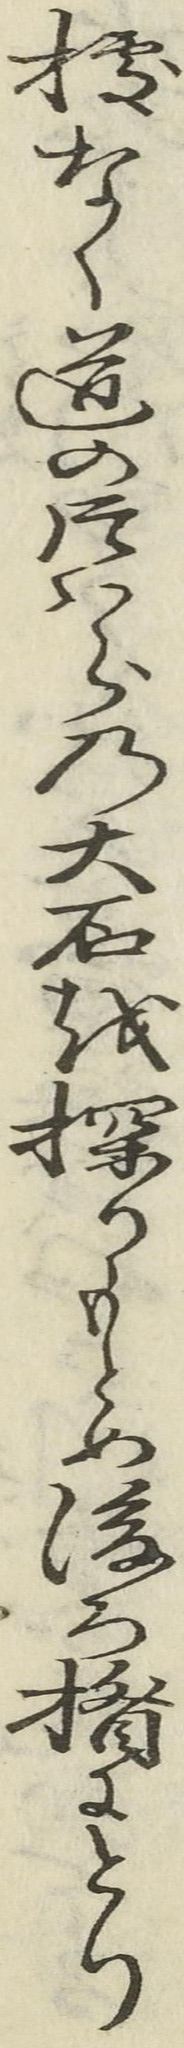拠なく道の片はらの大石を探りもとめ後ろ楯にとり
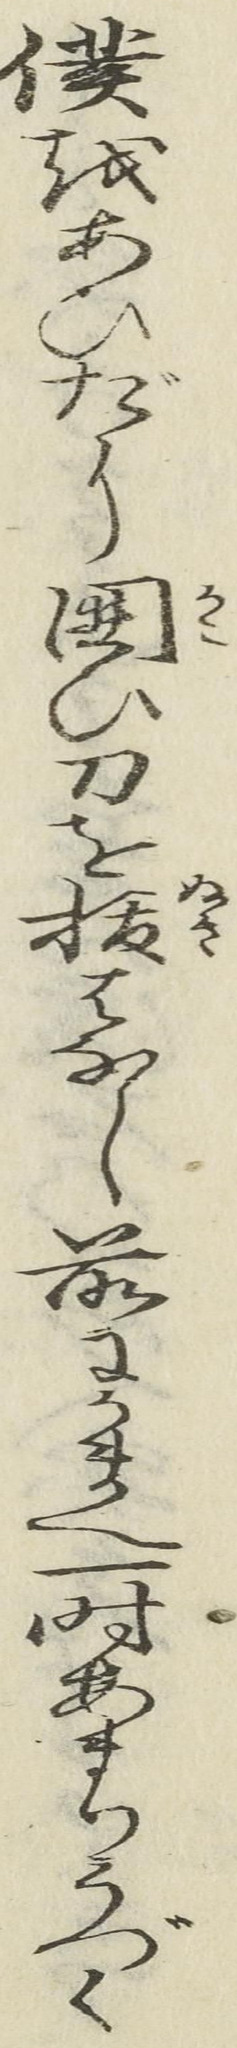僕をあひだに囲ひ刀を抜はなし前にかまへ一時あまりうづく
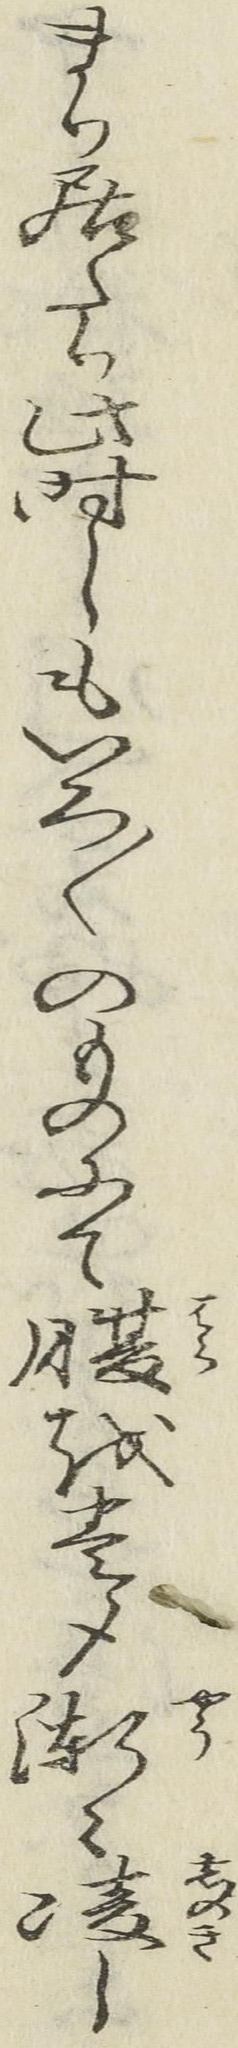まり居たり此時しもいろ〳〵のものにて腹を巻〆漸々凌し
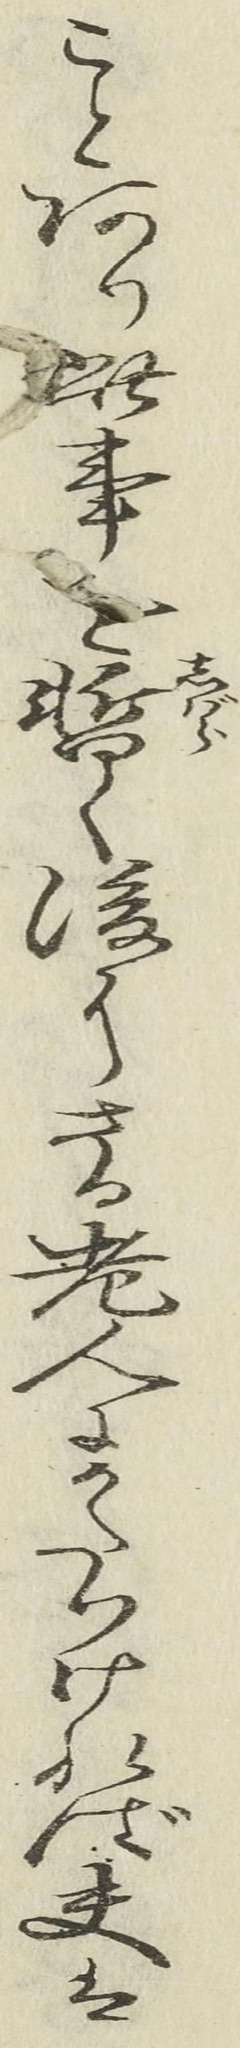ことあり此事を暫く後にさる老人にかたりければ夫は
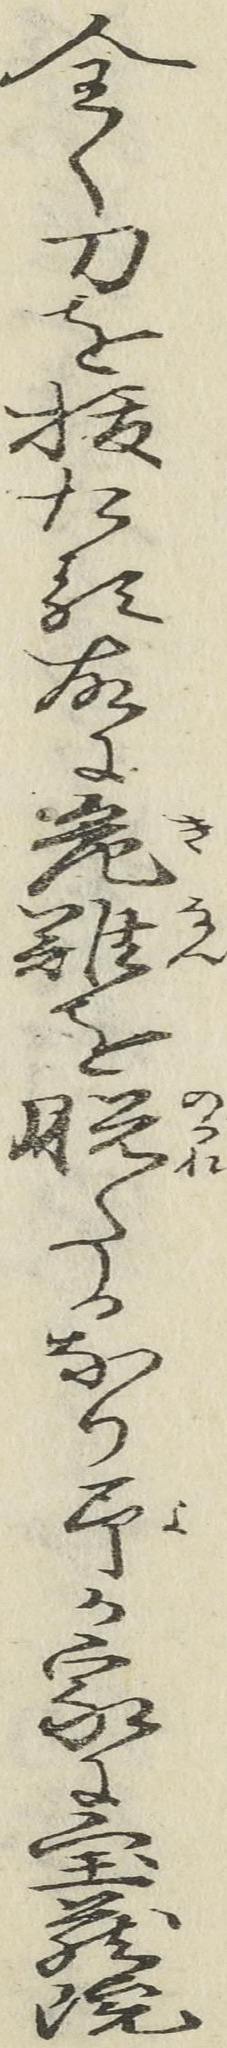全く刀を抜たる故に危難を脱たるなり予か家に宝蔵院
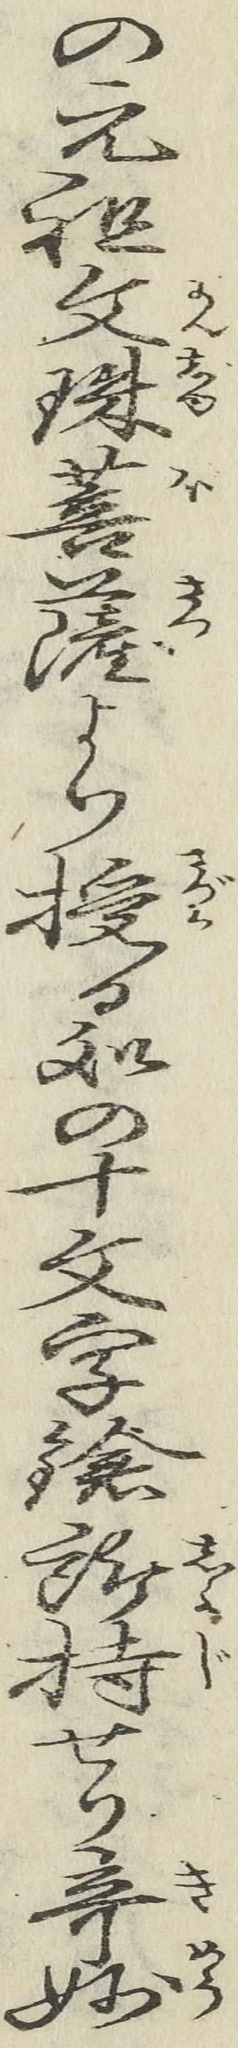の元祖文殊菩薩より授る処の十文字鎗所持せり奇妙
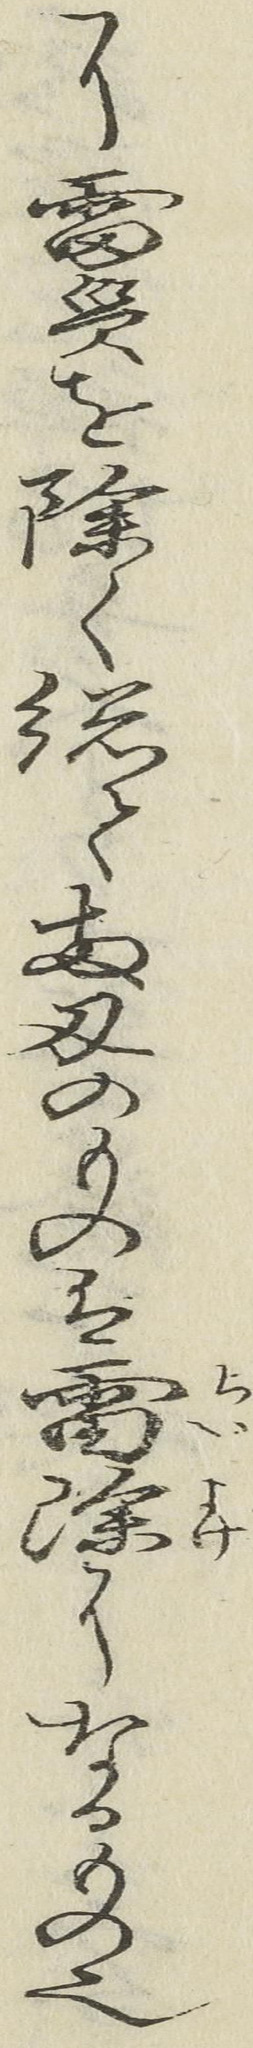に雷災を除く総て両刃のものは雷除になるもの也
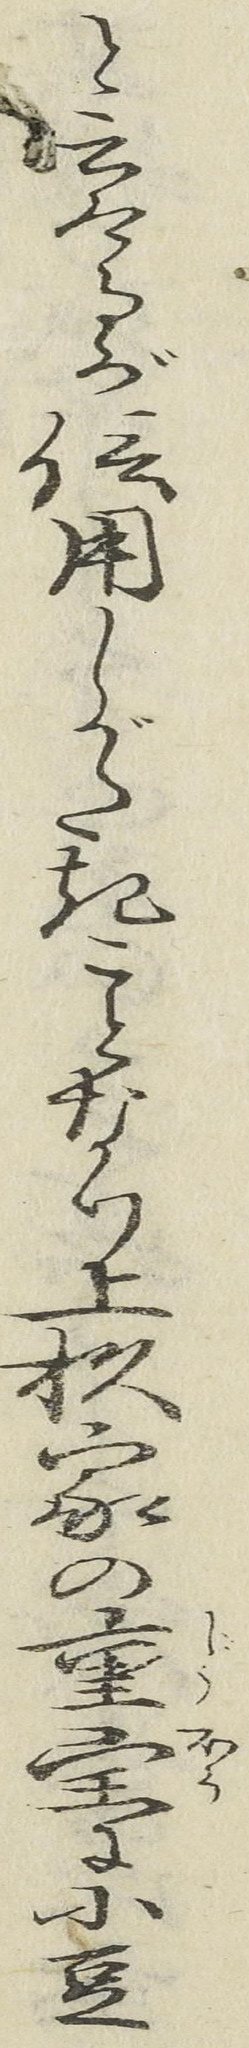と云けるが信用しがたきことなり上杉家の重宝に小豆
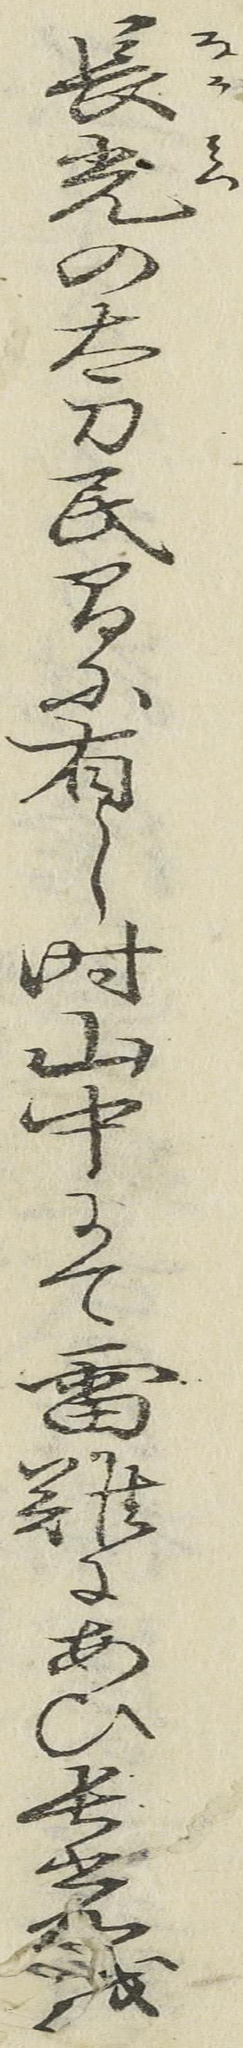長光の太刀民間に有し時山中にて雷難にあひ長光を
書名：震雷考説　全
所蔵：東京大学地震研究所図書室 Earthquake Research Institute Library, The University of Tokyo, JAPAN
